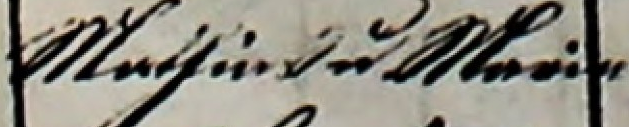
Mathias u Maria
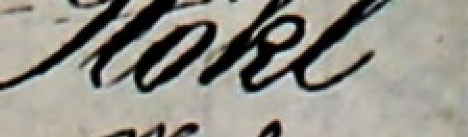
Stökl
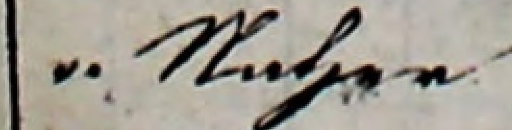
v. Natzer
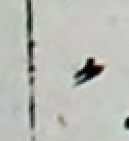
„
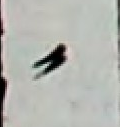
„
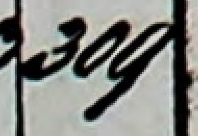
309
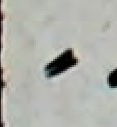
„
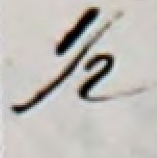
1/2
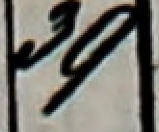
39
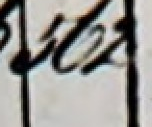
562
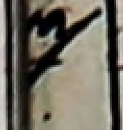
17
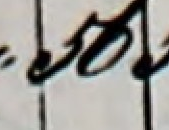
56
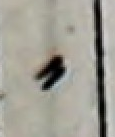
„
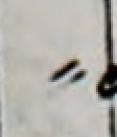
„
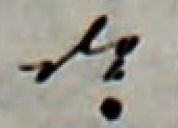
Do
